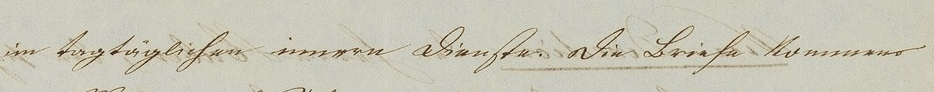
im tagtäglichen innern Dienste. Die Briefe kommen
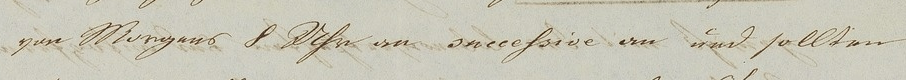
von Morgens 8 Uhr an sucsessive an und sollten
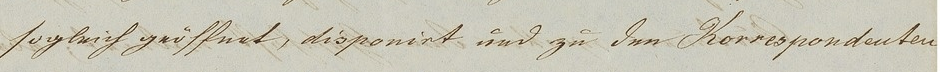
sogleich geöffnet, disponirt und zu den Korrespondenten
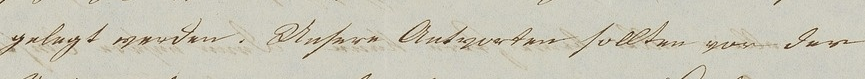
gelegt werden. Unsere Antworten sollten vor der
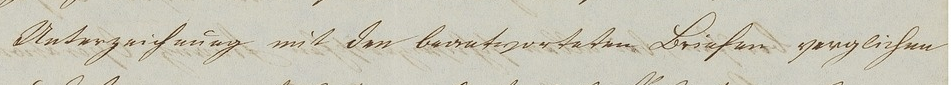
Unterzeichnung mit den beantworteten Briefen verglichen
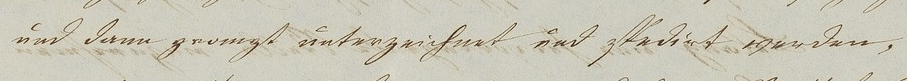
und dann prompt unterzeichnet und spedirt werden,
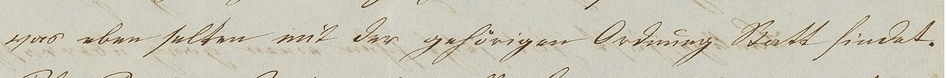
was eben selten mit der gehörigen Ordnung Statt findet.
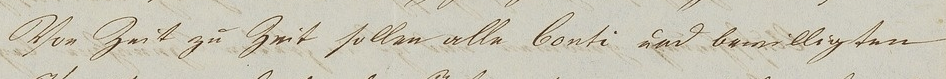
Von Zeit zu Zeit sollen alle Conti und bewilligten
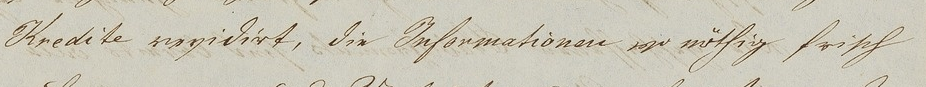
Kredite revidirt, die Informationen wo nöthig frisch
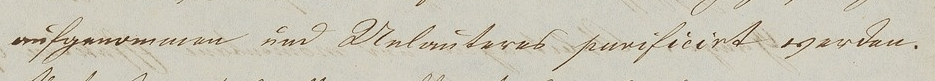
aufgenommen und Unlauteres purificirt werden.
